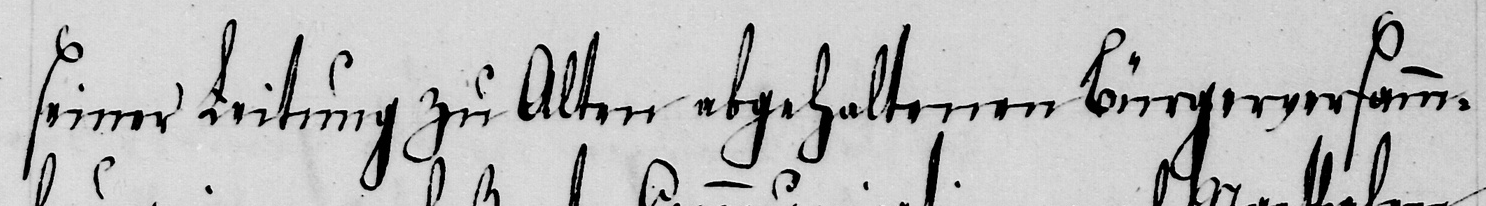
seiner Leitung zu Alten abgehaltenen Bürgerversamm¬
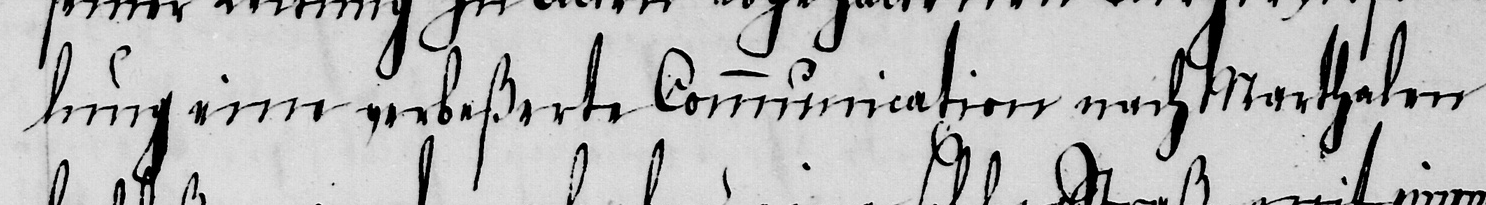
lung eine verbeßerte Communication nach Marthalen
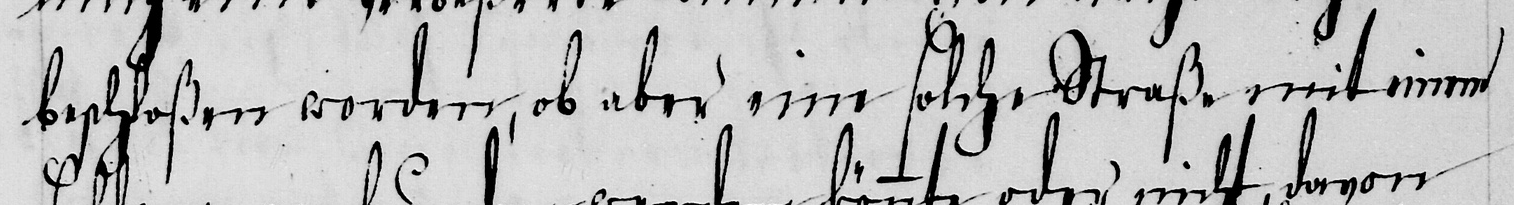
beschloßen worden, ob aber eine solche Straße mit einem
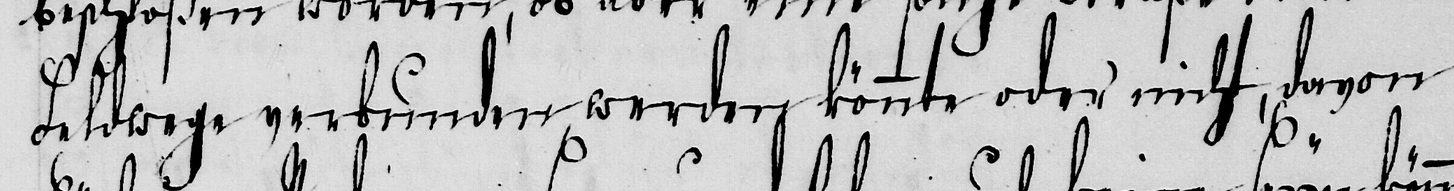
Feldwege verbunden werden könnte oder nicht, davon
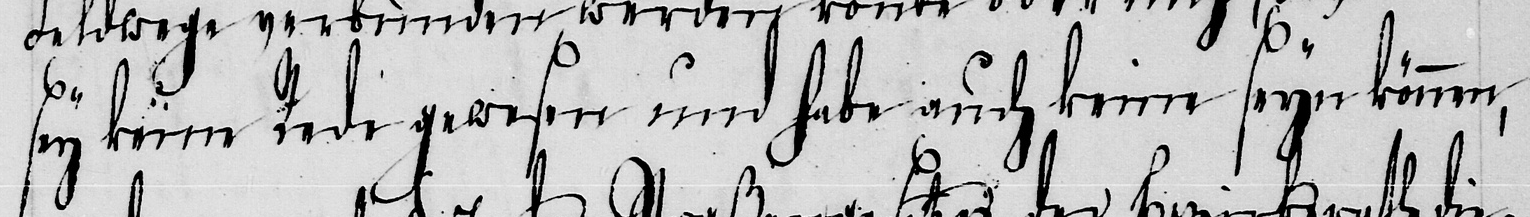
sey keine Rede gewesen und habe auch keine seyn können,
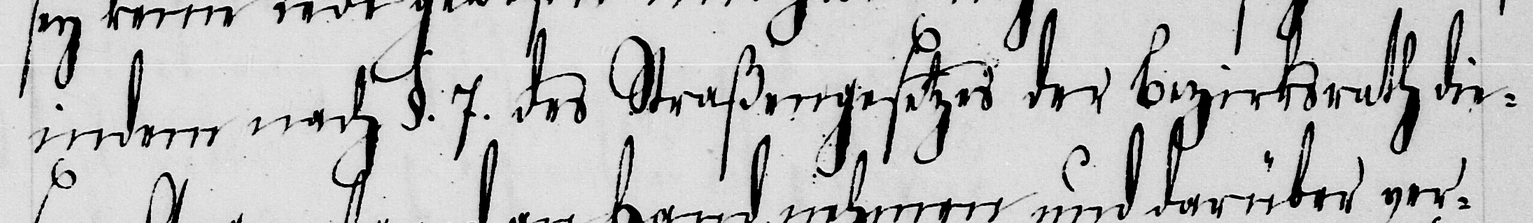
indem nach §. 7. des Straßengesetzes der Bezirksrath die¬
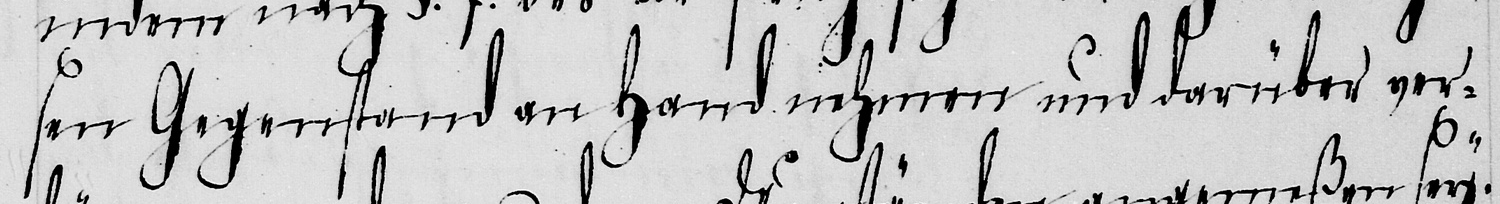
sen Gegenstand an Hand nehmen und darüber ver¬
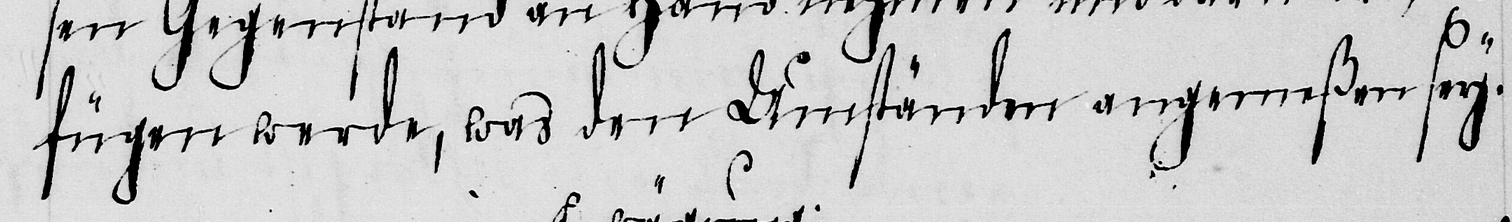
fügen werde, was den Umständen angemeßen sey.
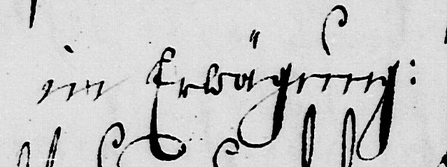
in Erwägung:
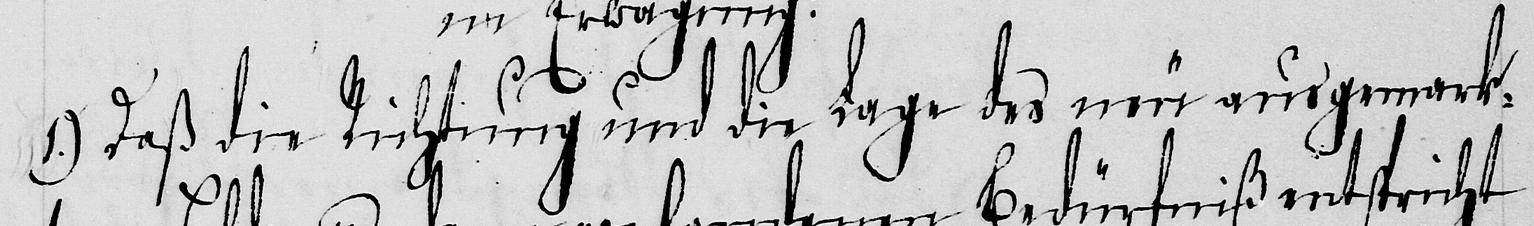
1.) Daß die Richtung und die Lage des neu ausgemark¬
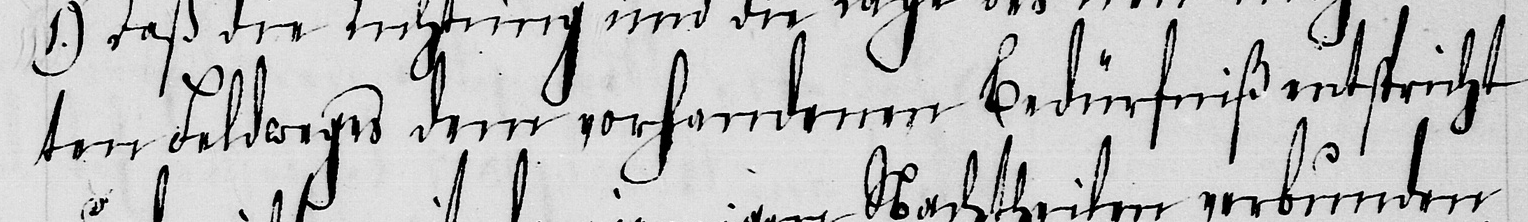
ten Feldweges dem vorhandenen Bedürfniß entspricht
